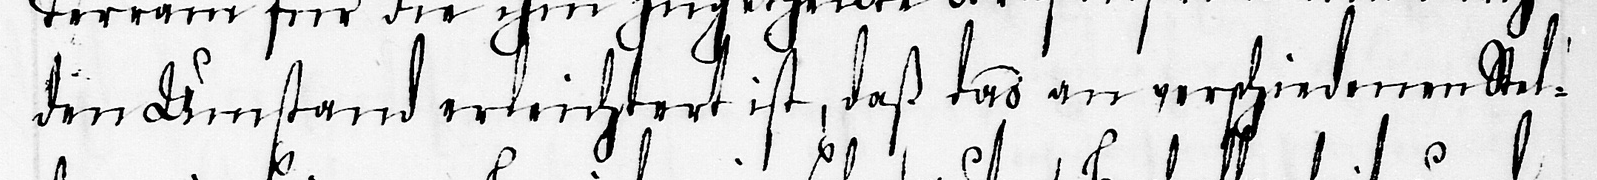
den Umstand erleichtert ist, daß das an verschiedenen Stel¬
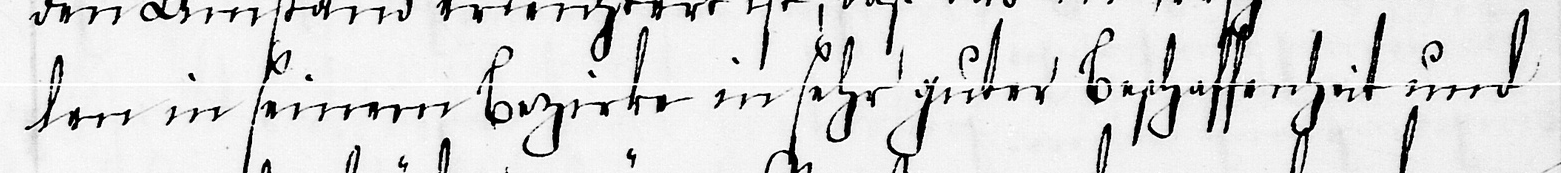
len in seinem Bezirke in sehr guter Beschaffenheit und
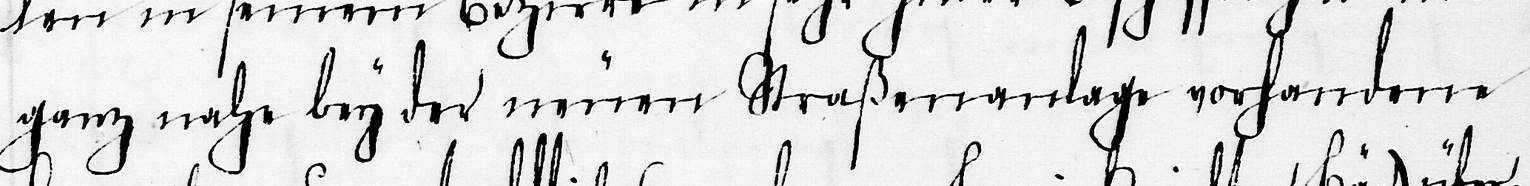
ganz nahe bey der neuen Straßenanlage vorhandene
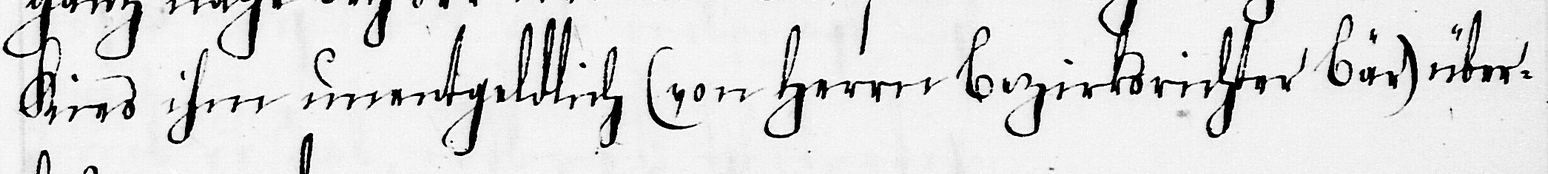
Kies ihm unentgeldlich (von Herrn Bezirksrichter Bär) über¬
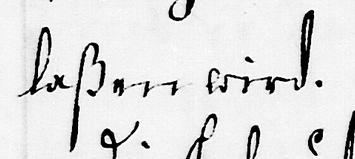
laßen wird.
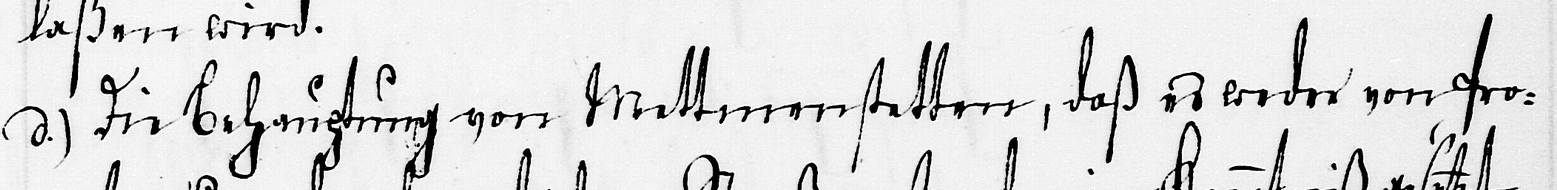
d.) Die Behauptung von Mettmenstetten, daß es weder von Pro¬
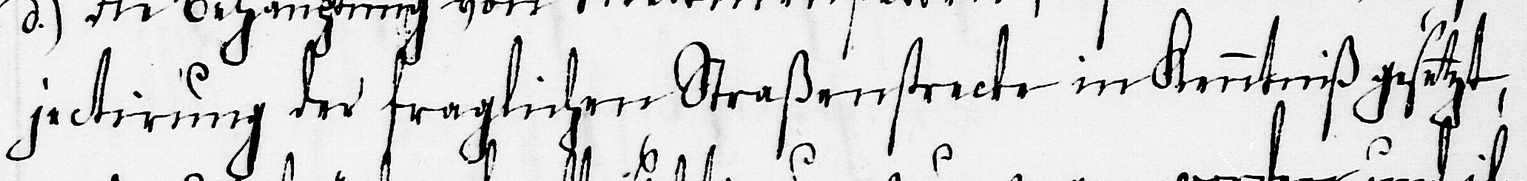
jectirung der fraglichen Straßenstrecke in Kenntniß gesetzt,
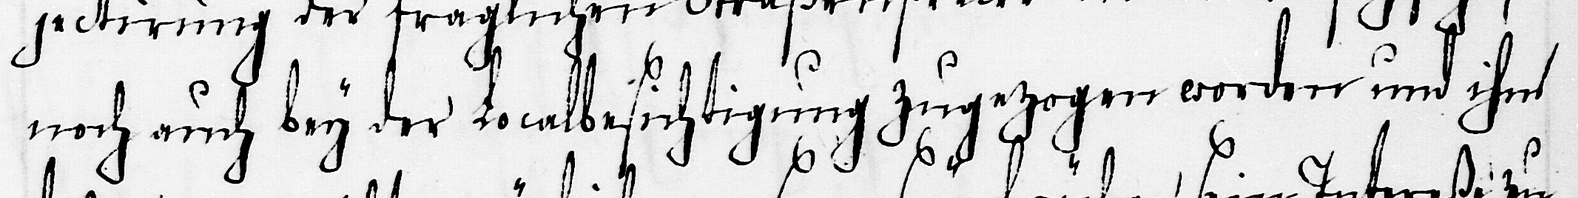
noch auch bey der Localbesichtigung zugezogen worden und ihm
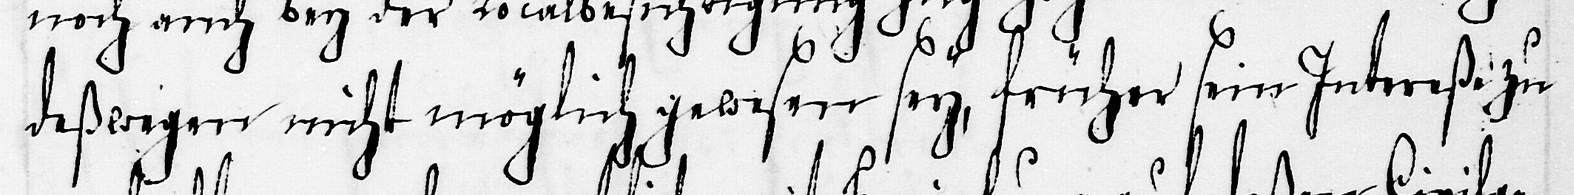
deßwegen nicht möglich gewesen sey, früher sein Intereße zu
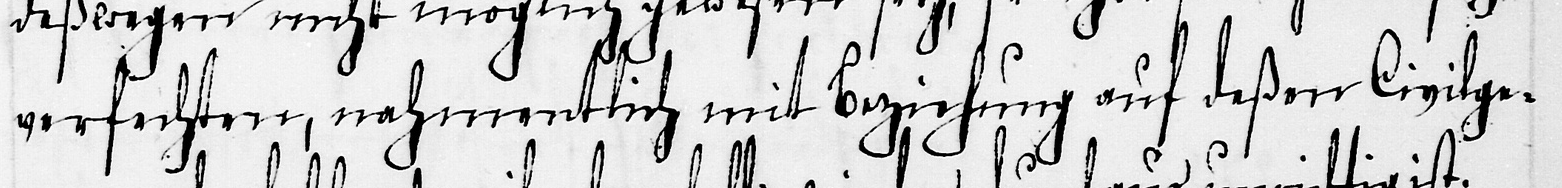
verfechten, nahmentlich mit Beziehung auf deßen Civilge¬
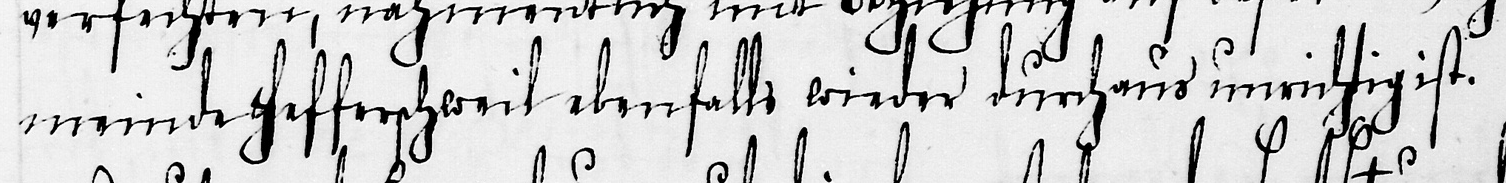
meinde Hefferschweil ebenfalls wieder durchaus unrichtig ist.
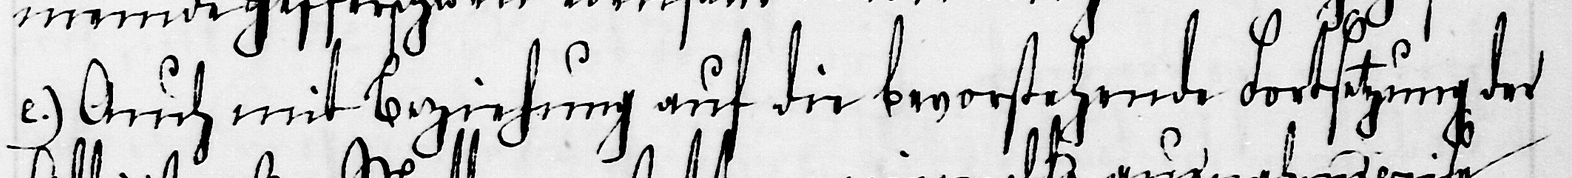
e.) Auch mit Beziehung auf die bevorstehende Fortsetzung der
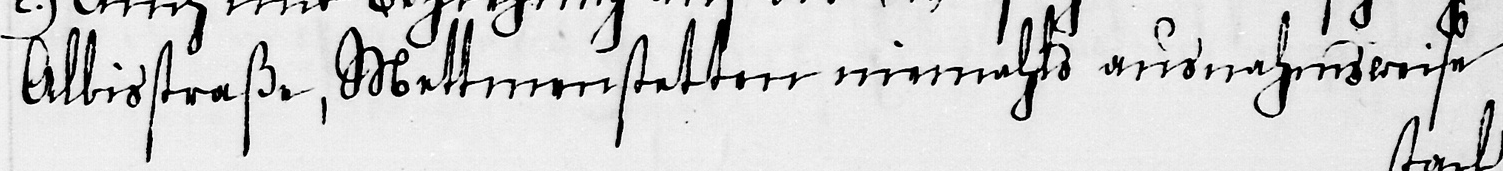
Albisstraße, Mettmenstetten niemahls ausnahmsweise
